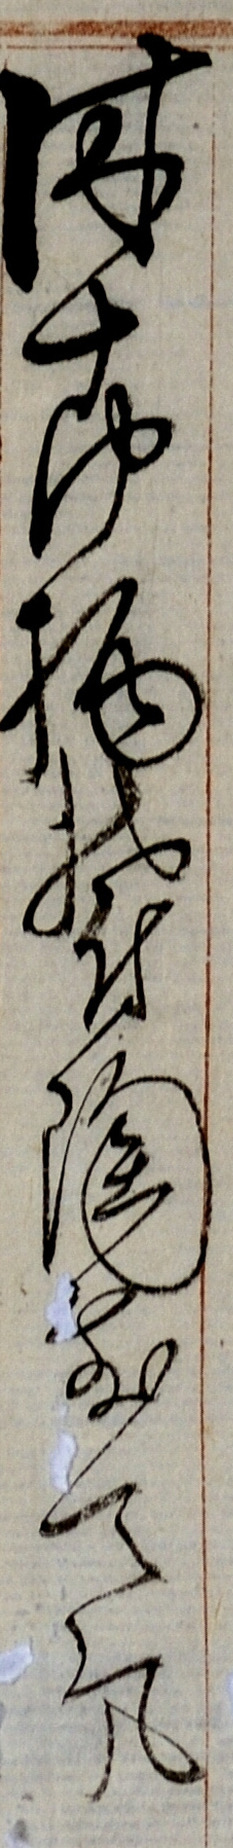時節柄鬱陶敷天気
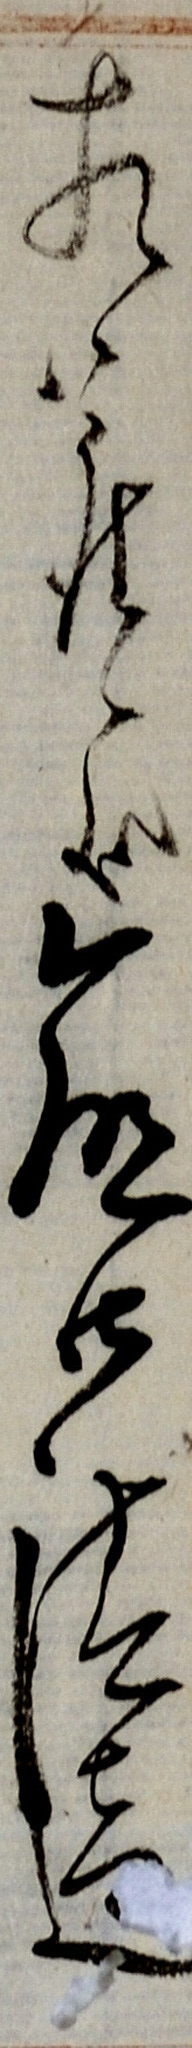相御座候処愈御清適
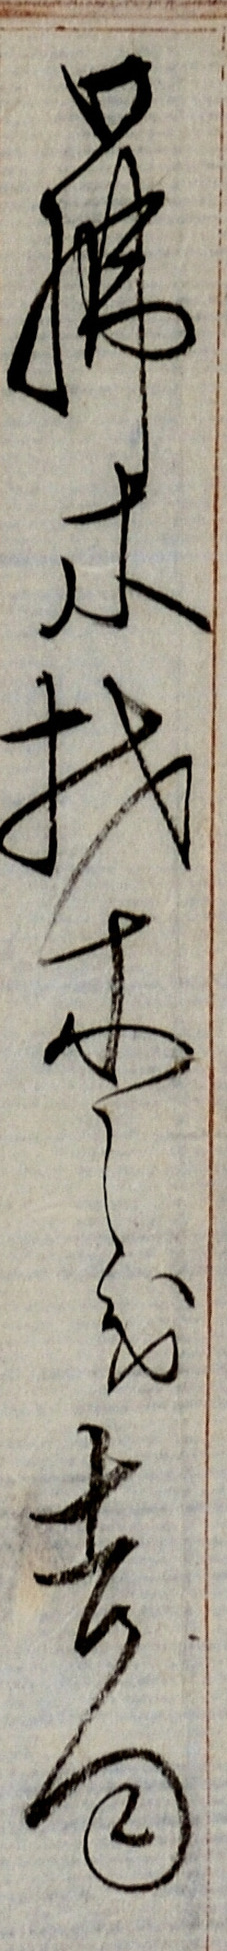御払木材木之義吉田
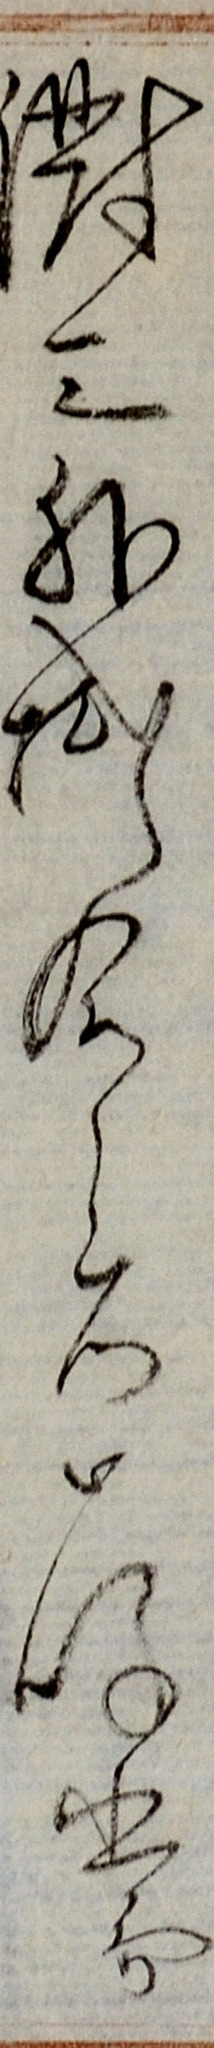濧三外掛り合之者御呼出候て
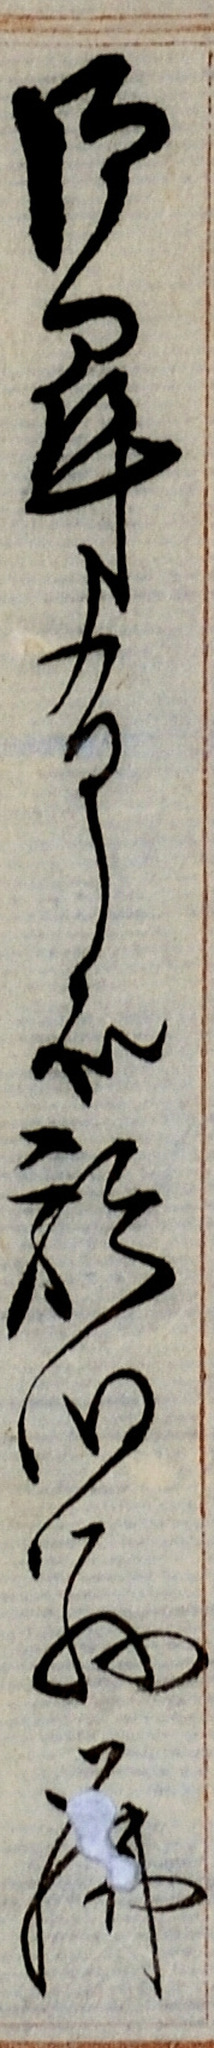御尋有之処於旧県御払
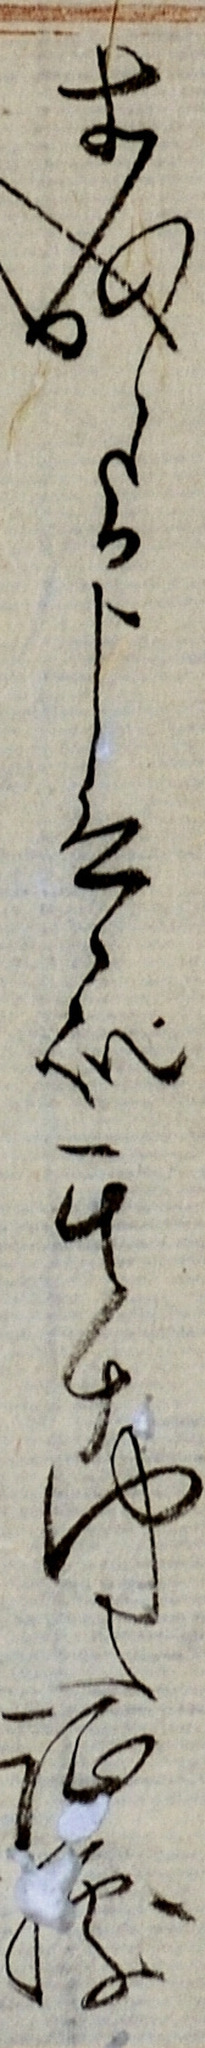相成候旨申立候処其節之証拠
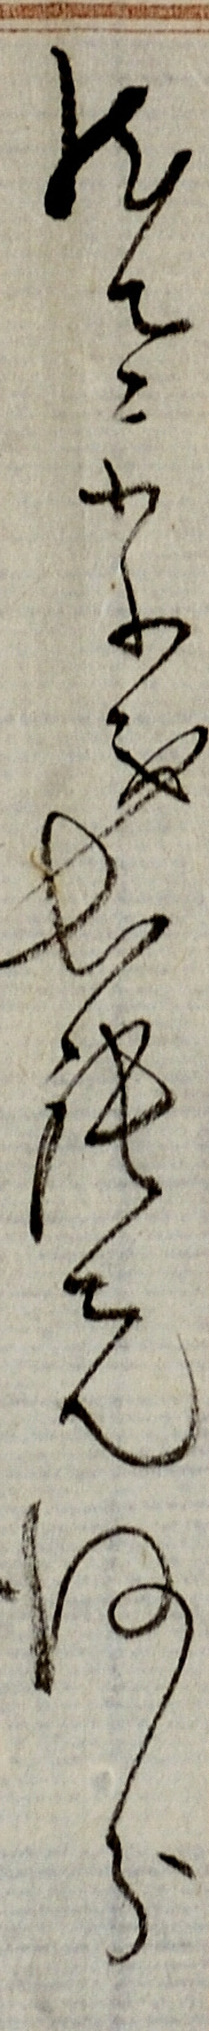然ルに小子義出張先何分
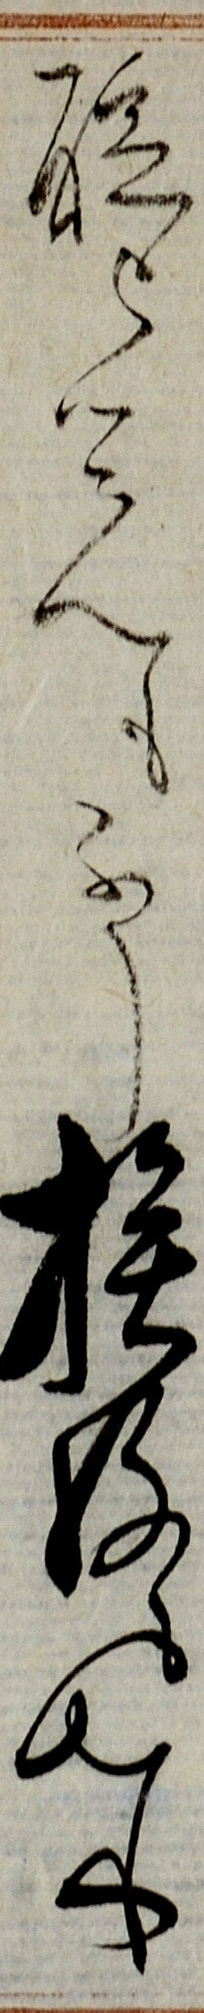聢と覚も不申挨拶も出来
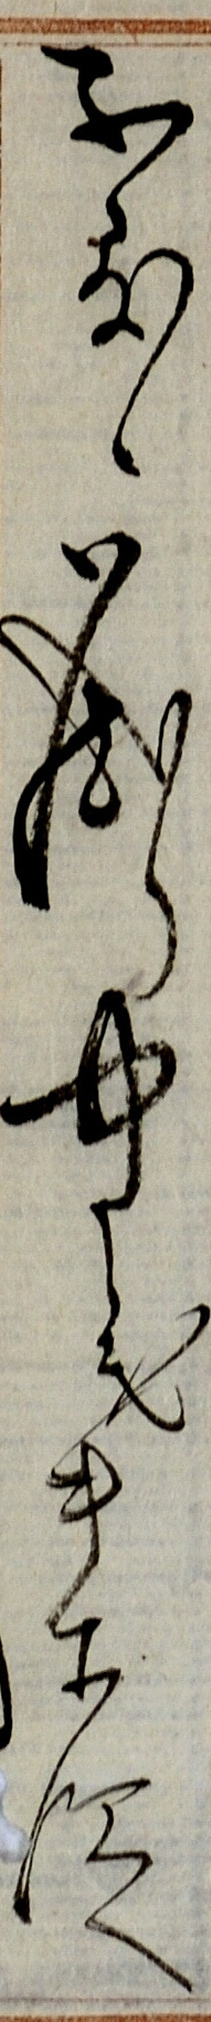不致候御掛り中之義貴所様へ
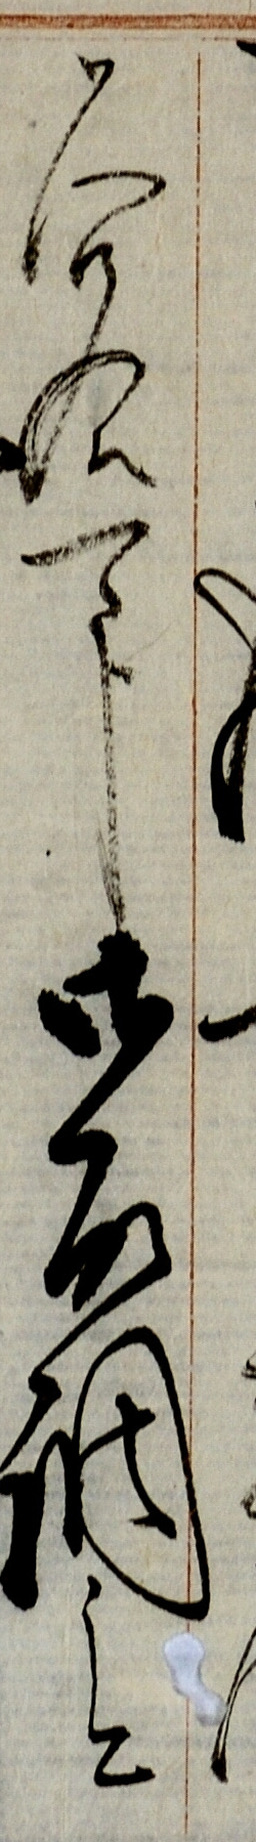御問合可申候御取調之上
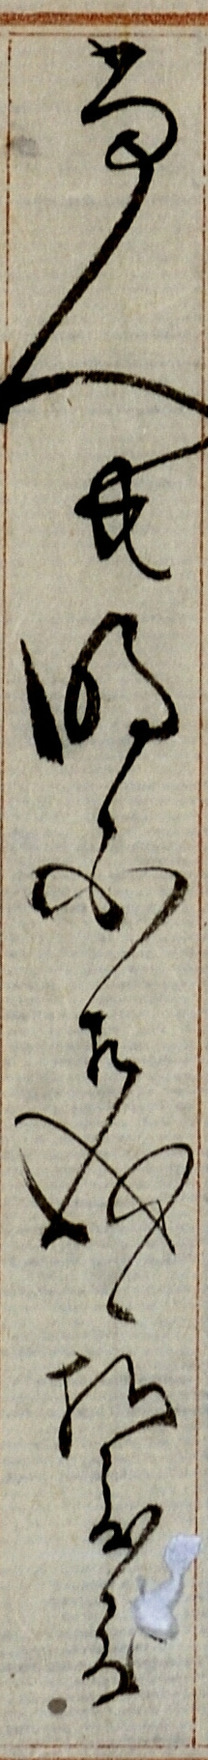当人共明白相成候様致度
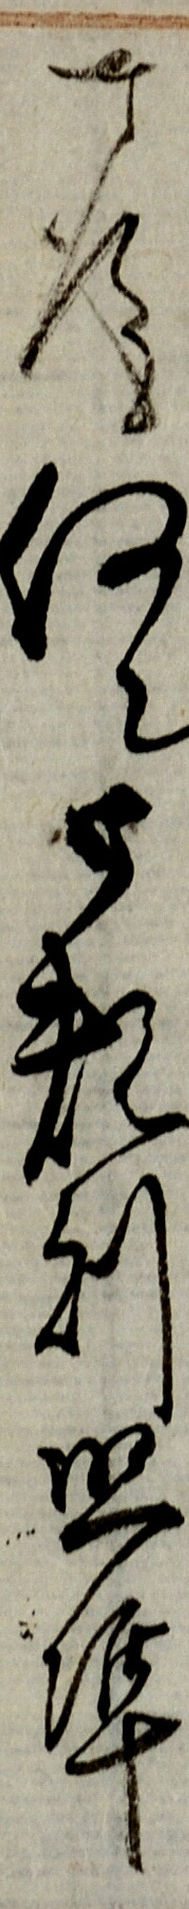奉存候何レ御規則照準
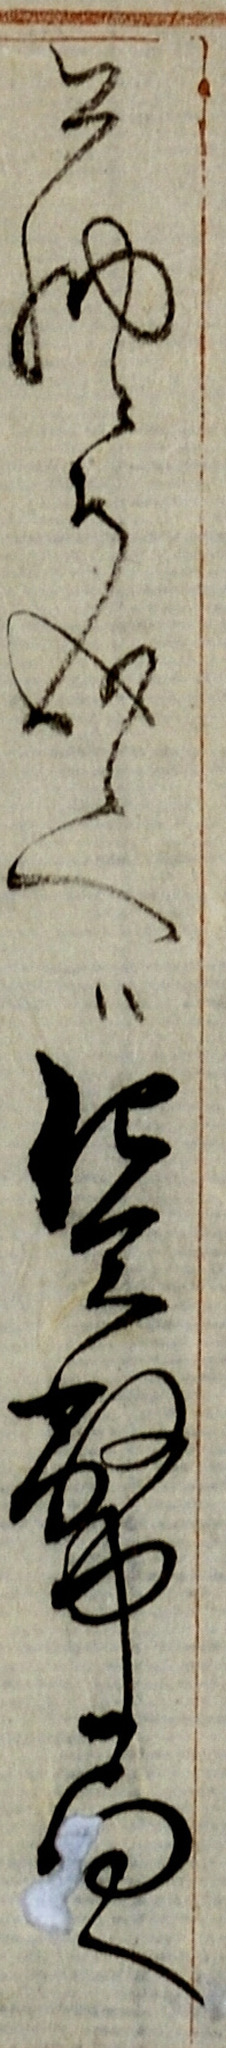公納に相成候へは貨幣局へ
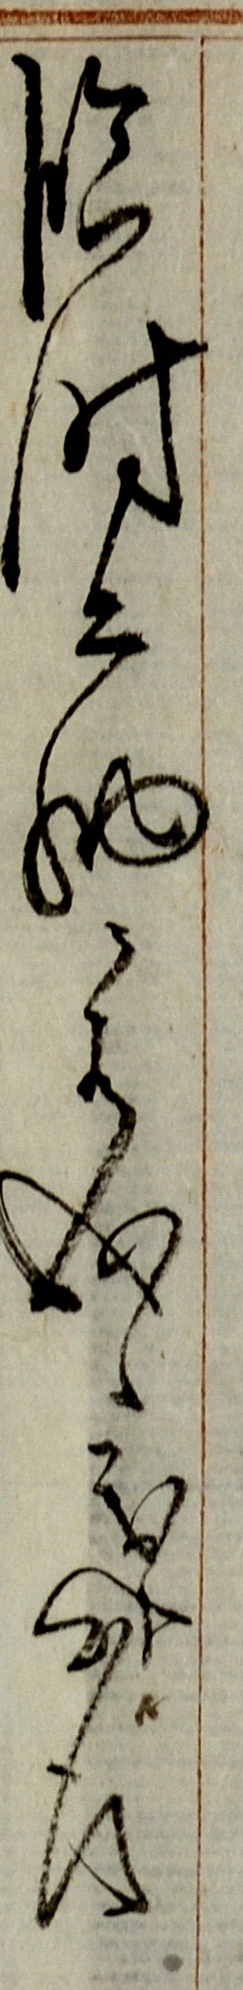臨時公納に相成候義トは心得
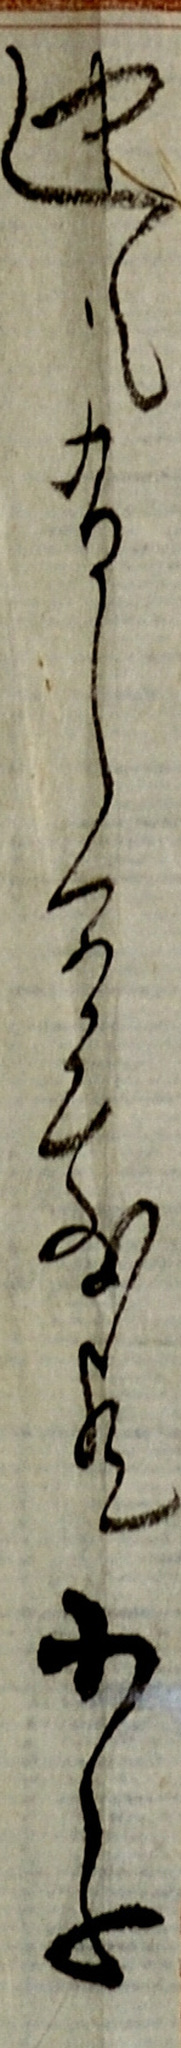迚も有之間敷歟小子

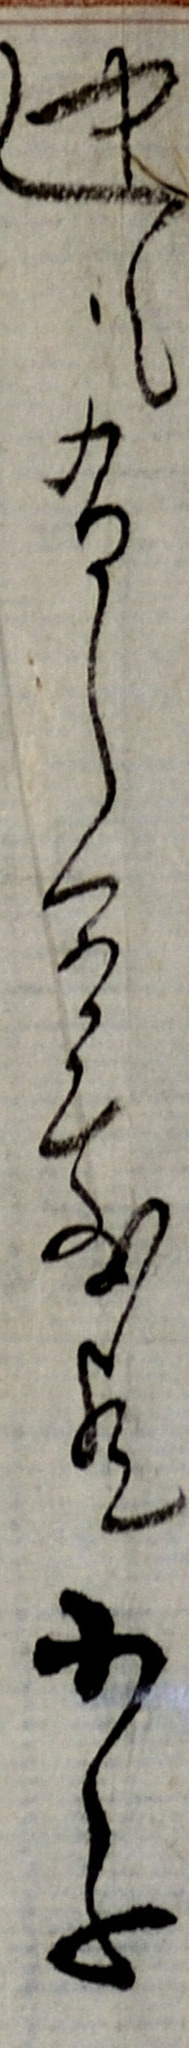迚も有之間敷歟小子
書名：書状
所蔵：伊那市立高遠町図書館・合同会社AMANE
